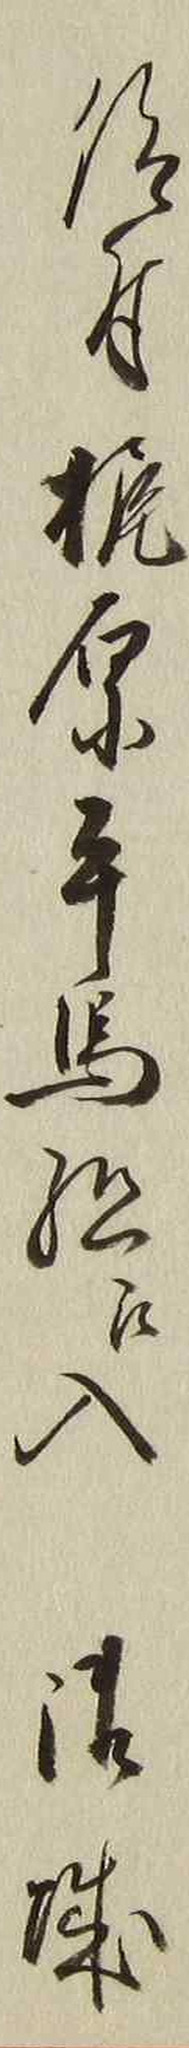仰付梶原平馬組へ入御城
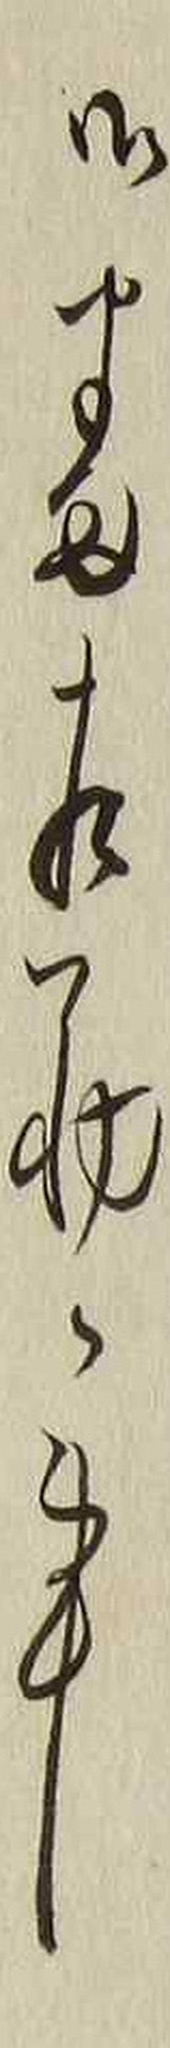御番相勤候事
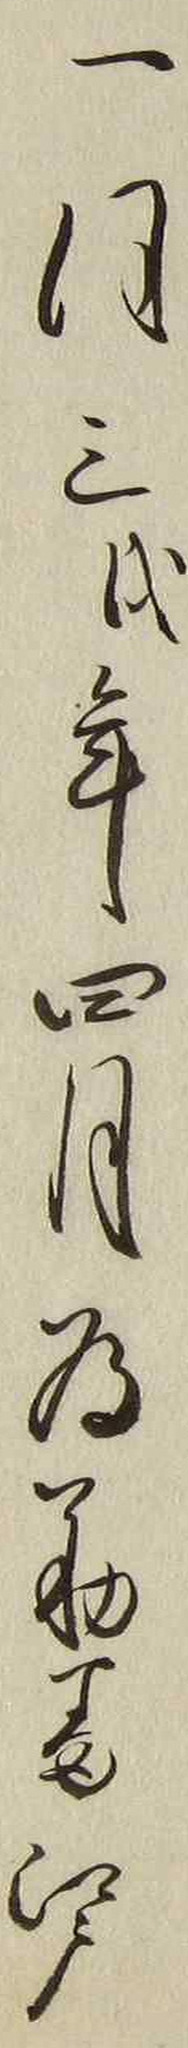一同三戌年四月為御勤番江戸
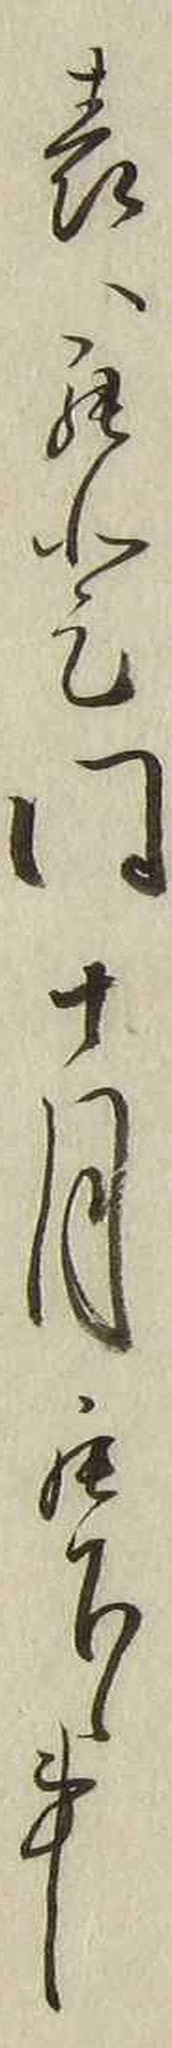表へ罷登同十月罷下候事
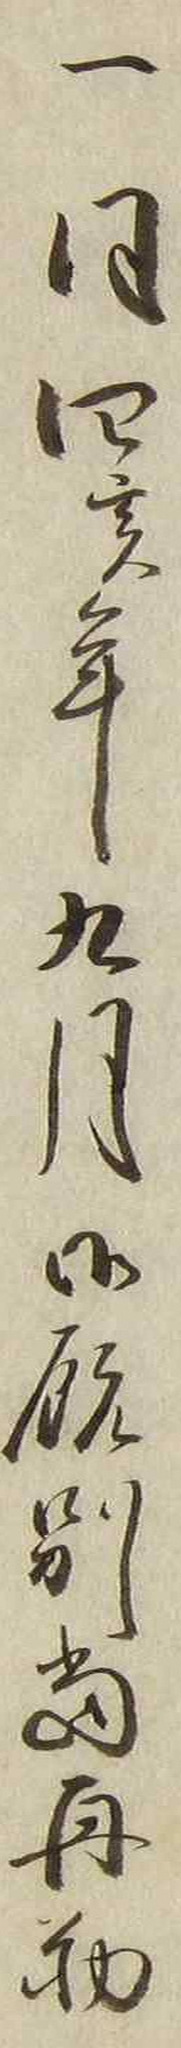一同四亥年九月御厩別当再勤

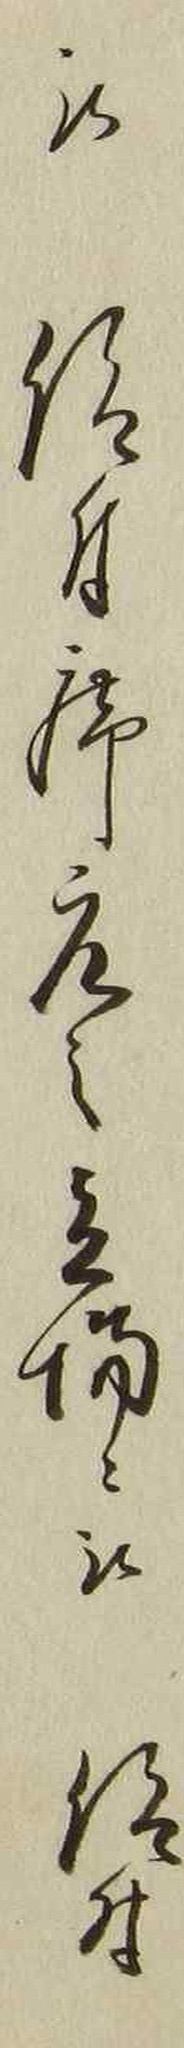被仰付席元之立場ニ被仰付
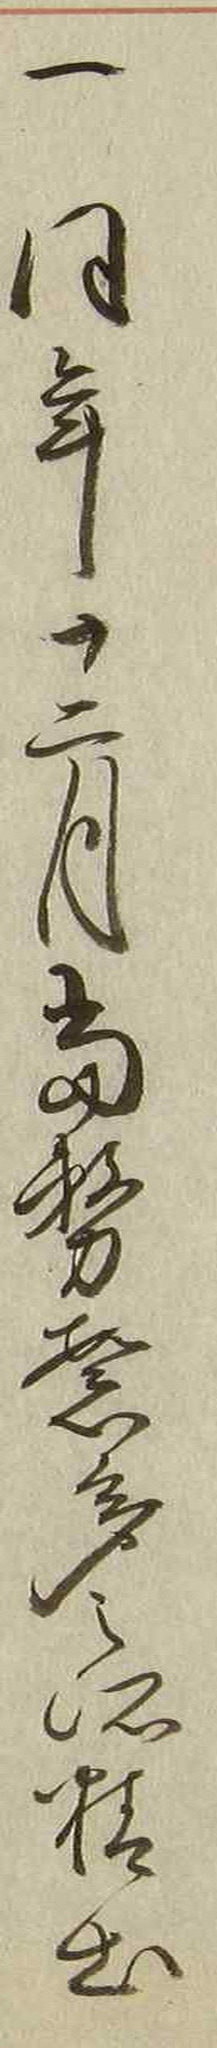一同年十二月当務繁多之所精出
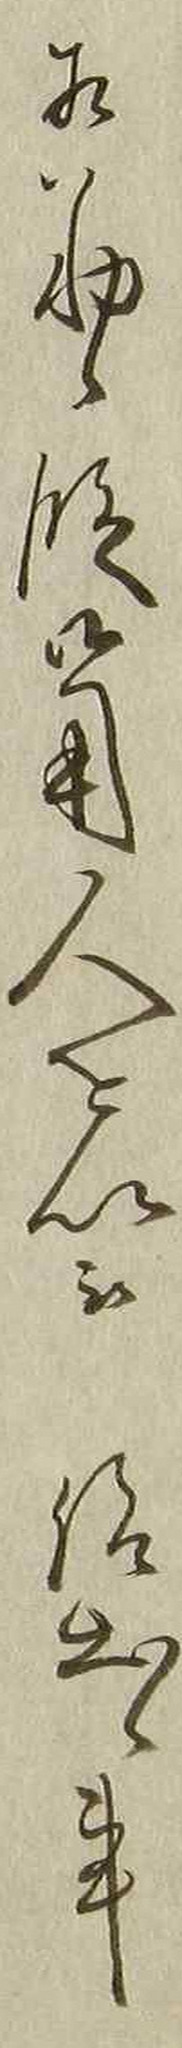相勤候段御用人を以被仰出候事
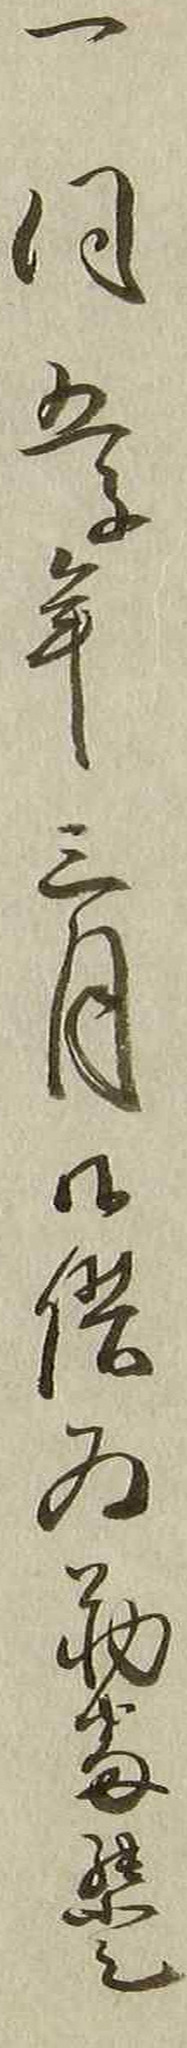一同年三月御供為勤番罷登
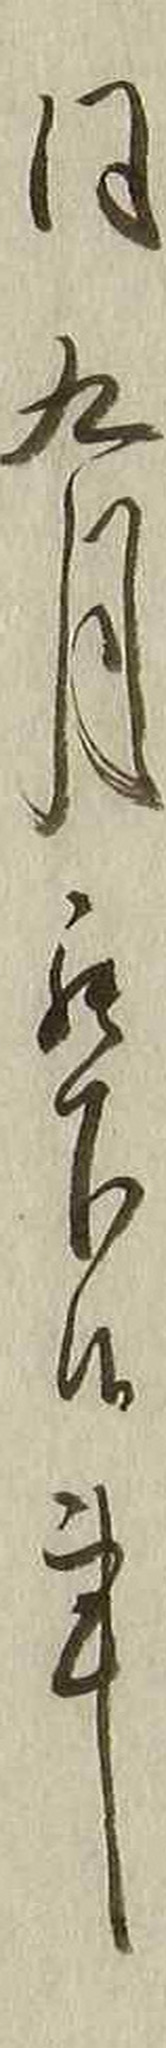同九月罷下候事
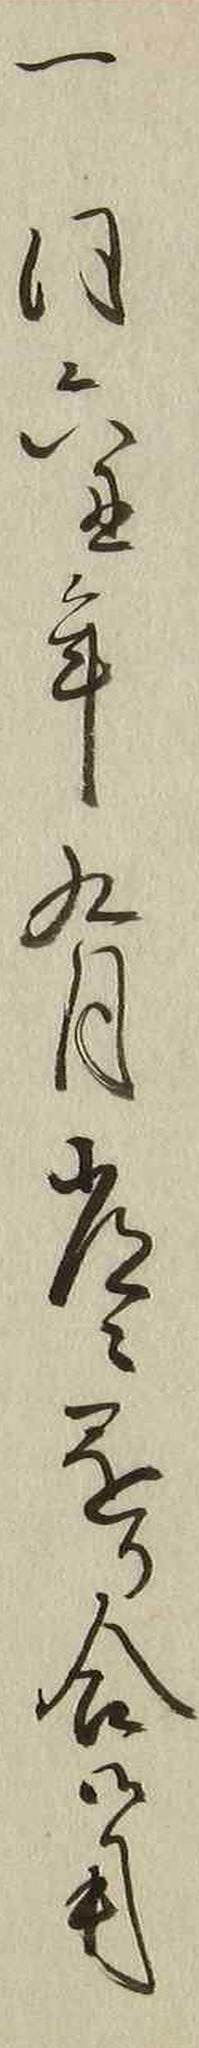一同六丑年九月常々懸り合御用
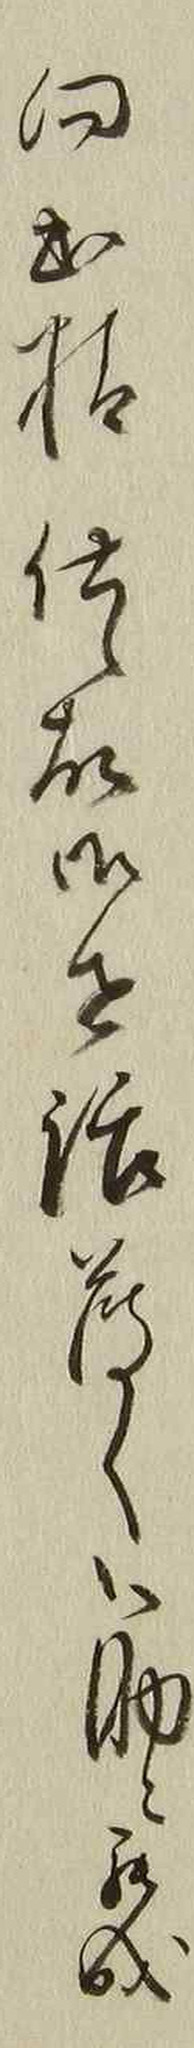向出精仕候故御世話薄く御助ニ罷成
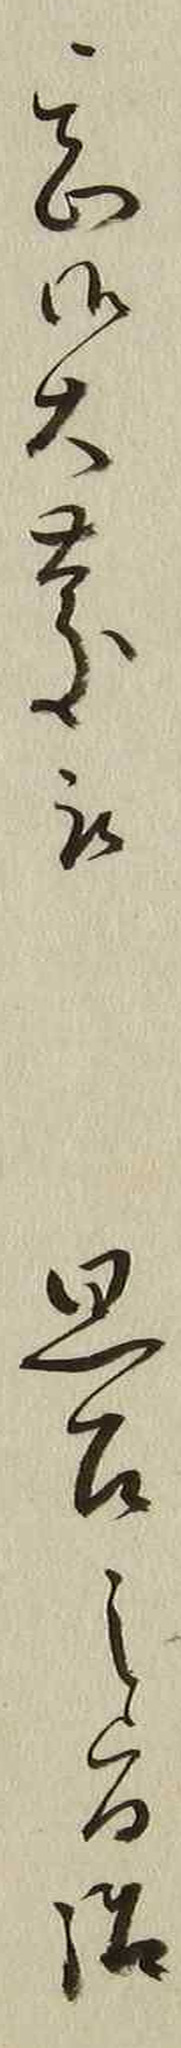甚御大慶被思召之旨御
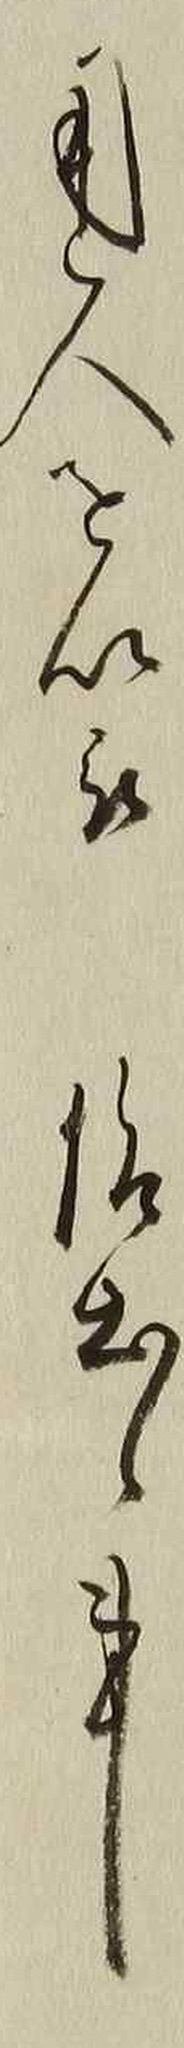用人を以被仰出候事
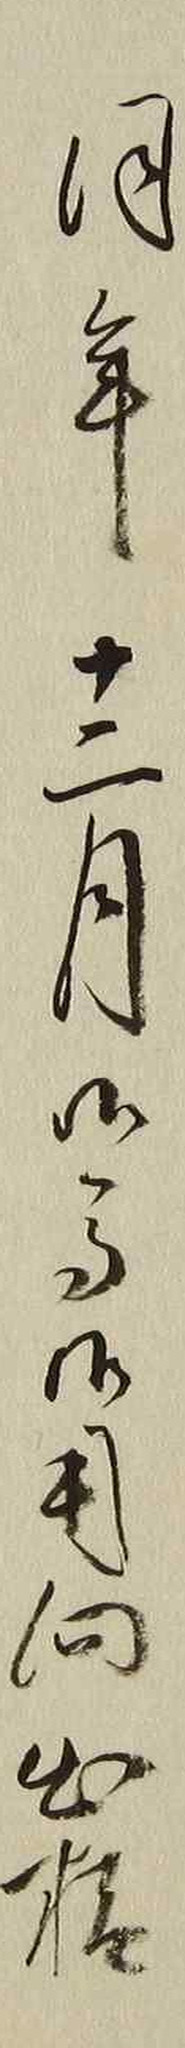一同年十二月御馬御用向出精
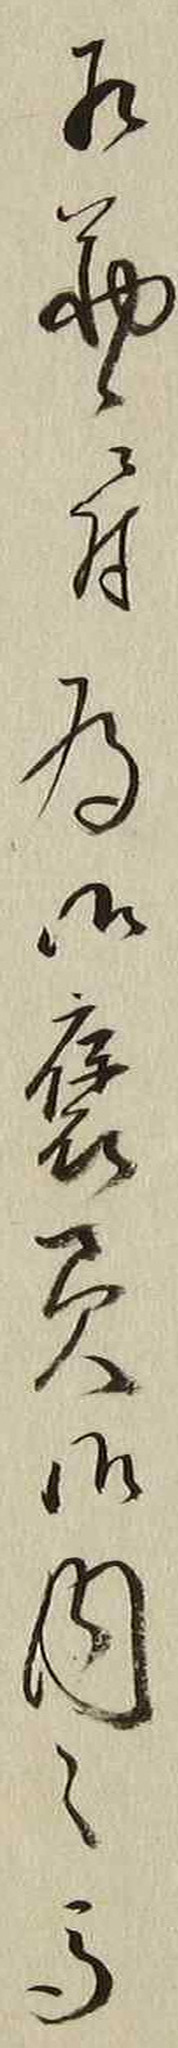相勤候ニ付為御褒美御内々馬
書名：諸士系譜　巻之18　い之部18
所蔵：会津若松市立会津図書館
